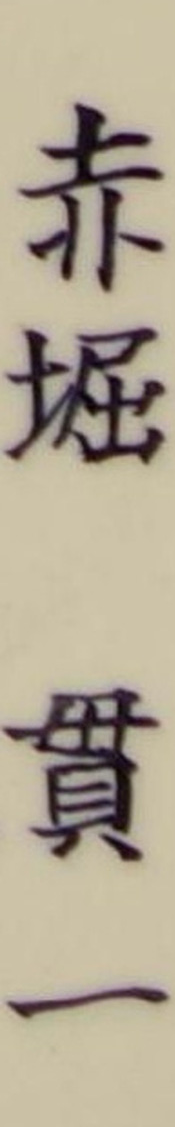赤堀貫一
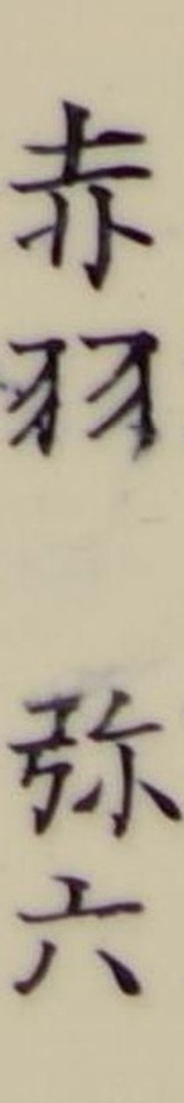赤羽弥六
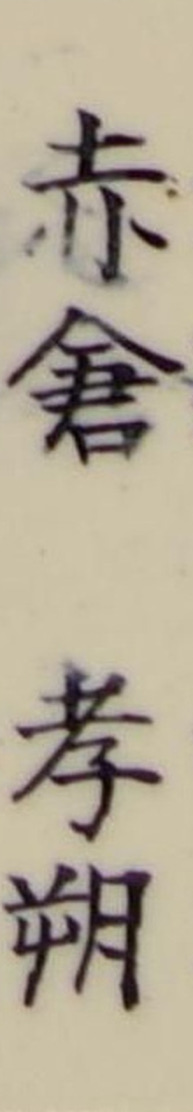赤倉孝朔
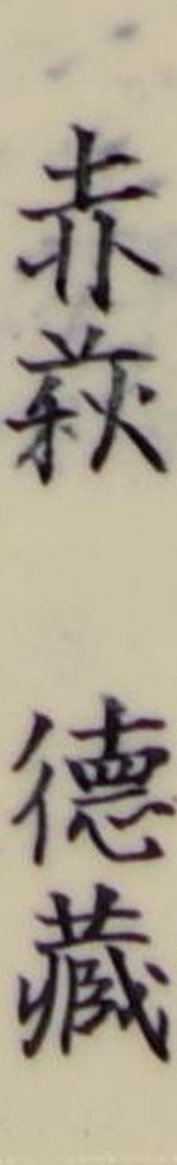赤萩徳蔵
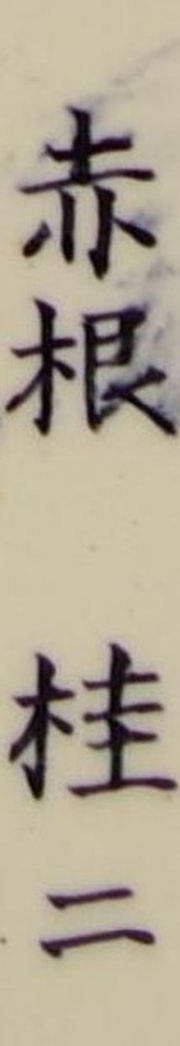赤根桂二
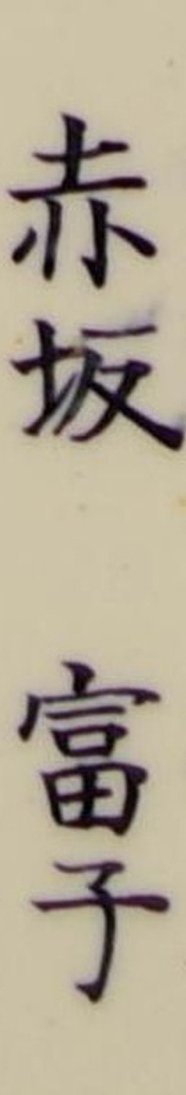赤坂富子
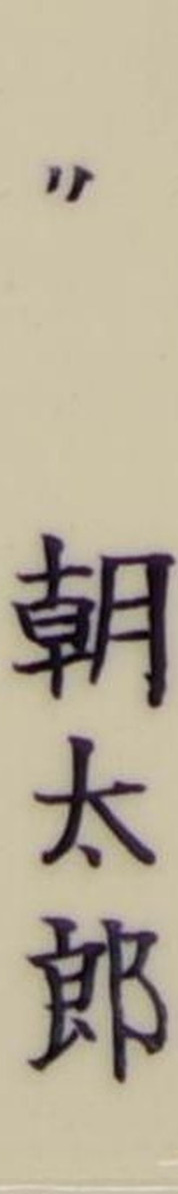朝太郎
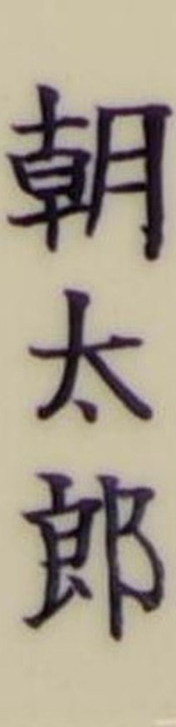朝太郎
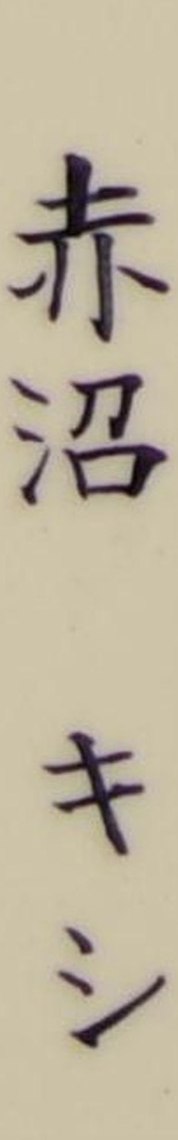赤沼キシ
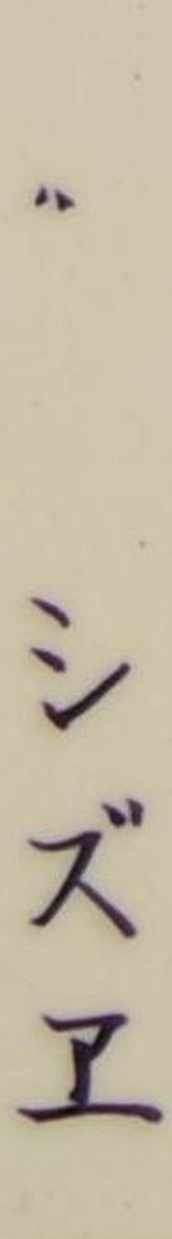シズヱ
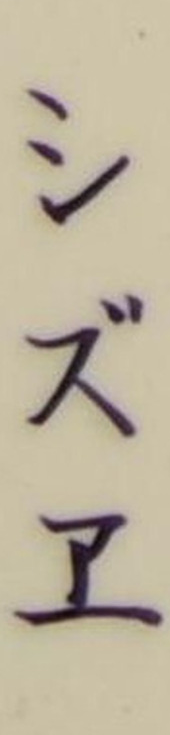シズヱ
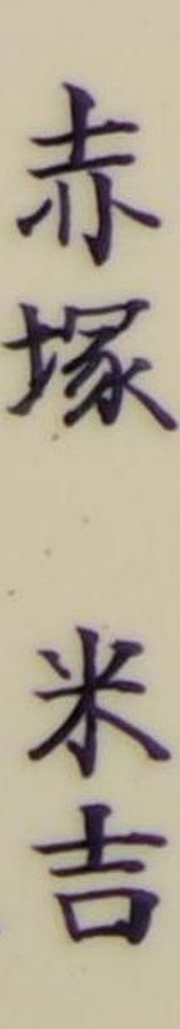赤塚米吉

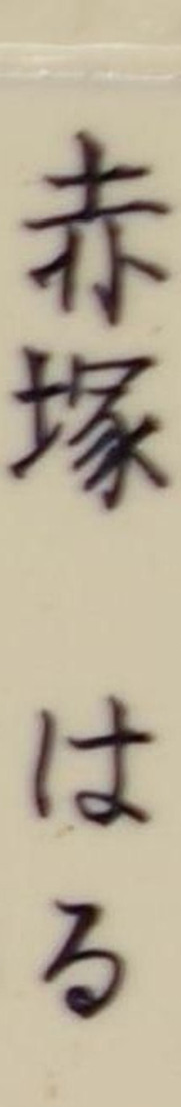赤塚はる
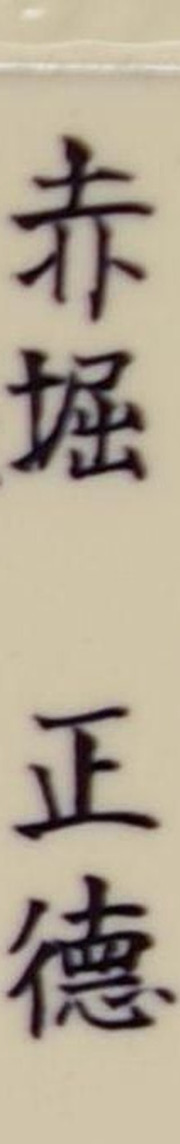赤堀正徳
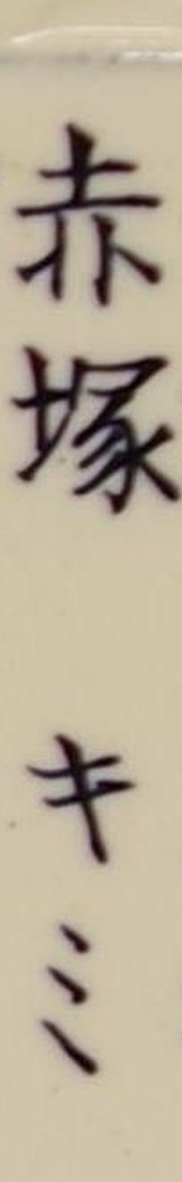赤塚キミ
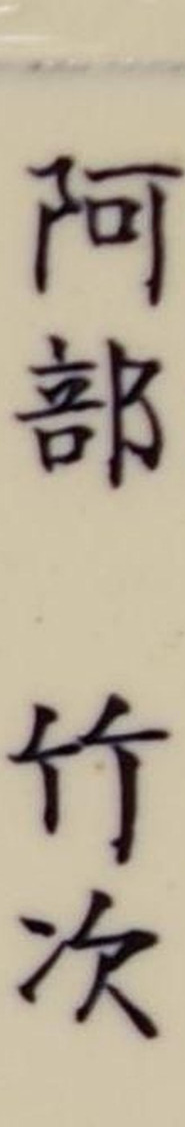阿部竹次
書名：E~L
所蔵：高野山金剛峯寺
